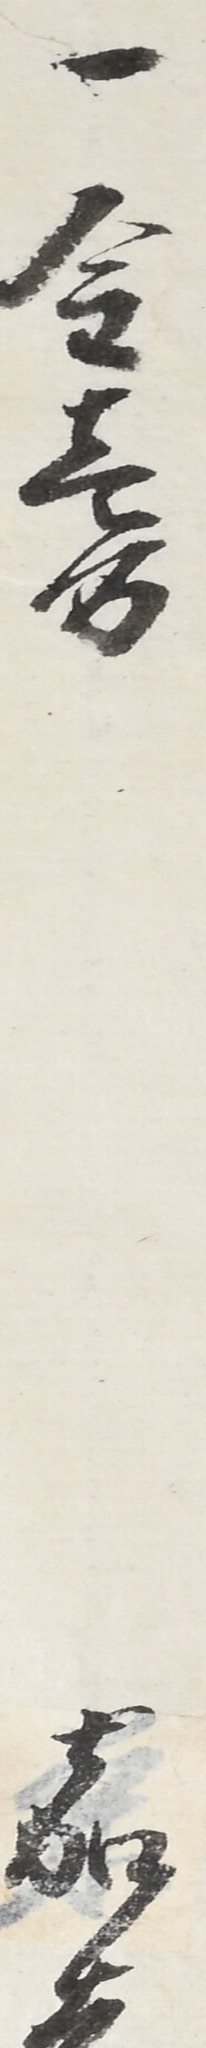一金壱分嘉吉

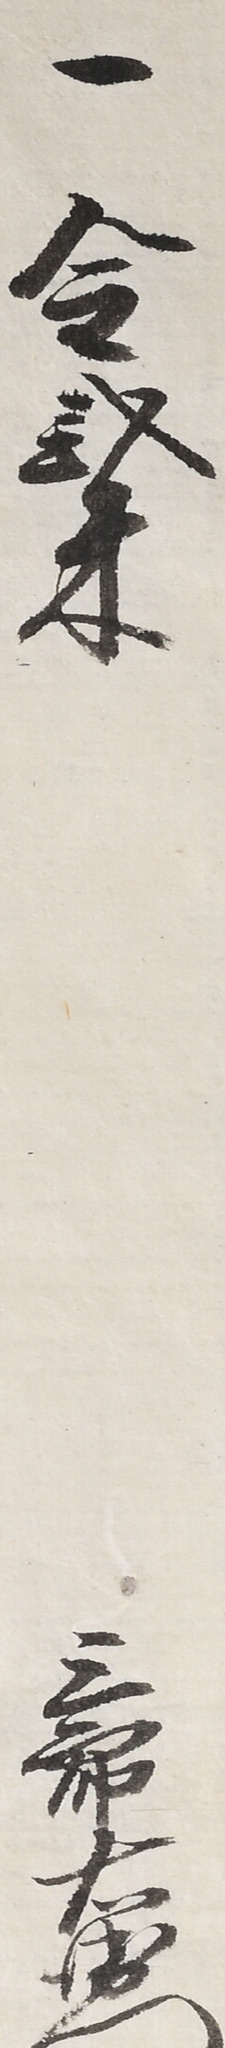一金弐朱三郎右衛門
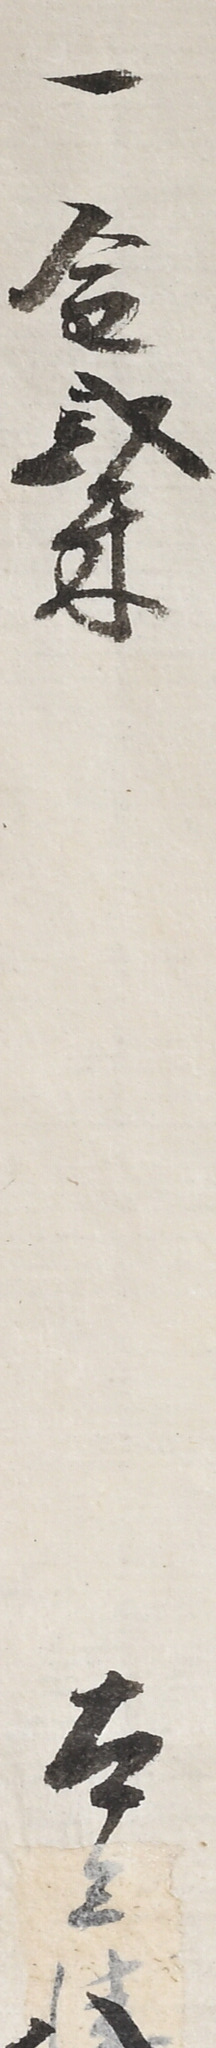一金弐朱太八
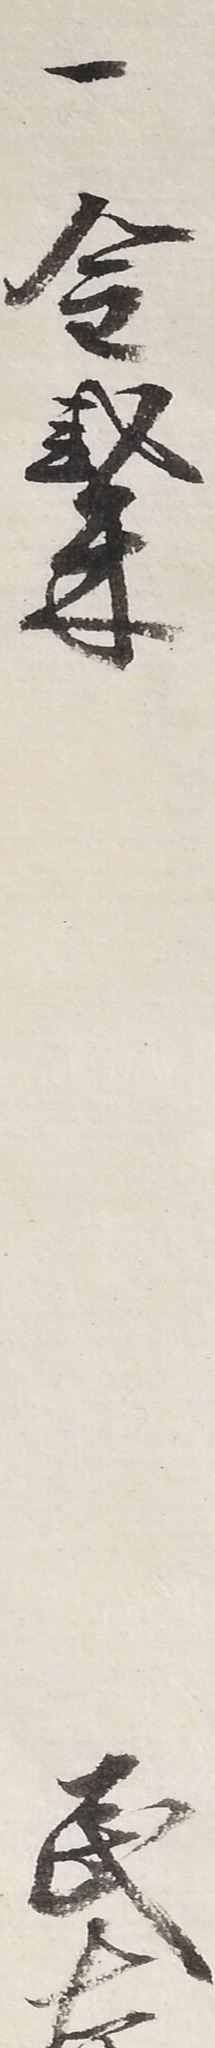一金弐朱武右衛門
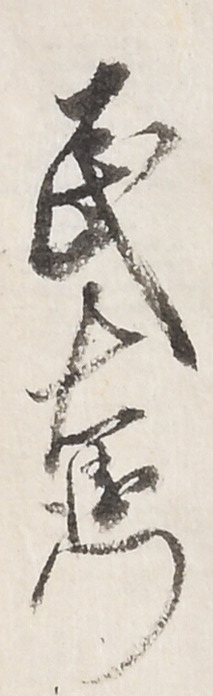庄右衛門
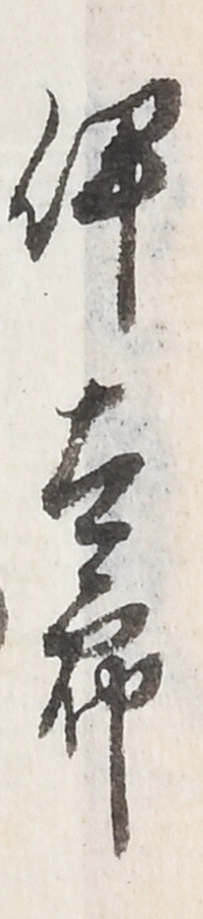伊太郎
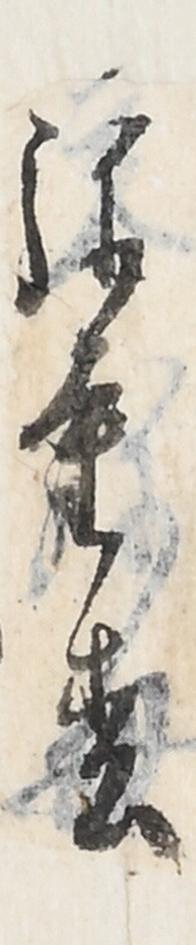弥重松
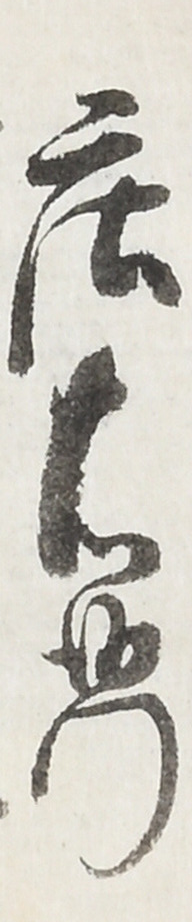庄右衛門
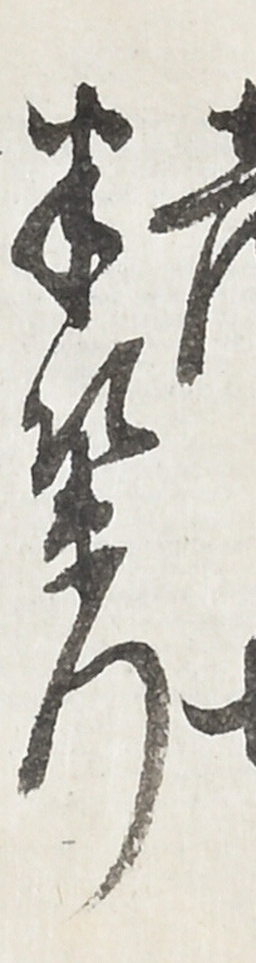半左衛門
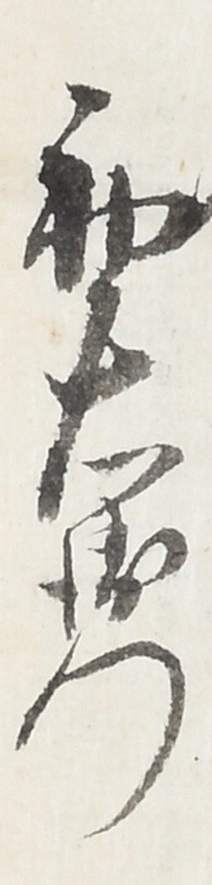初右衛門

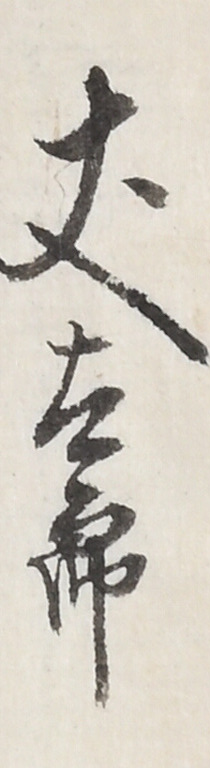丈太郎
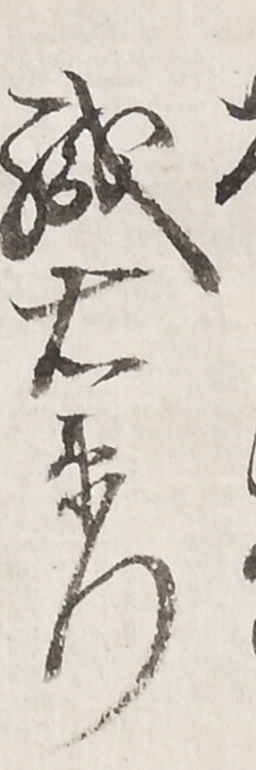伊右衛門
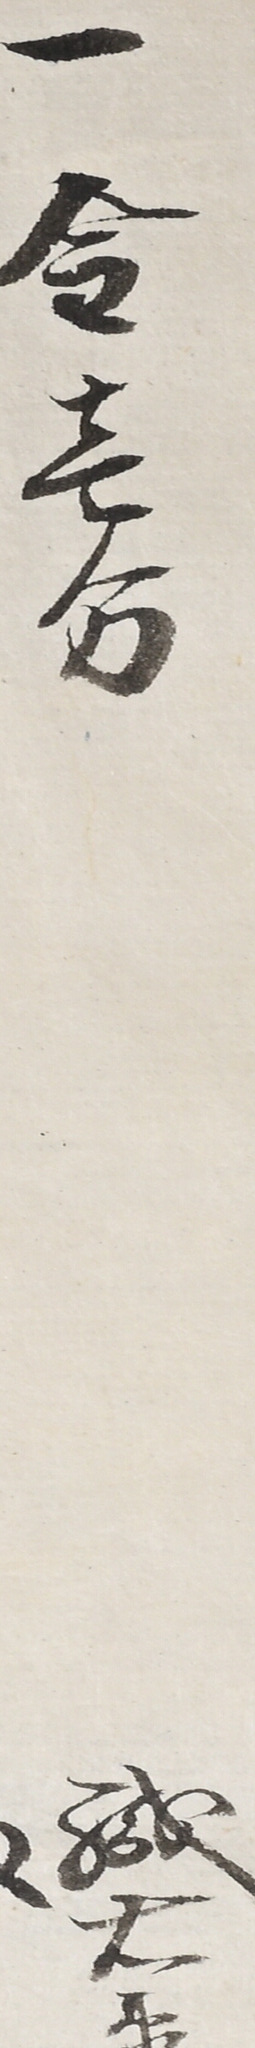一金壱分織右衛門
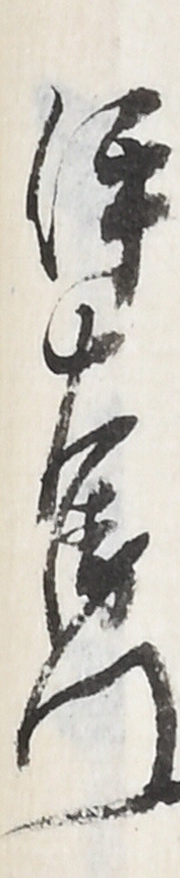伊右衛門
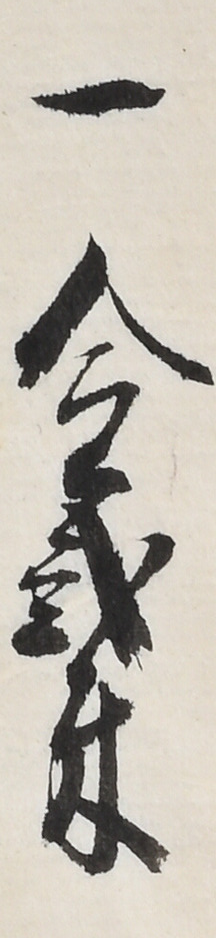一金弐朱藤蔵
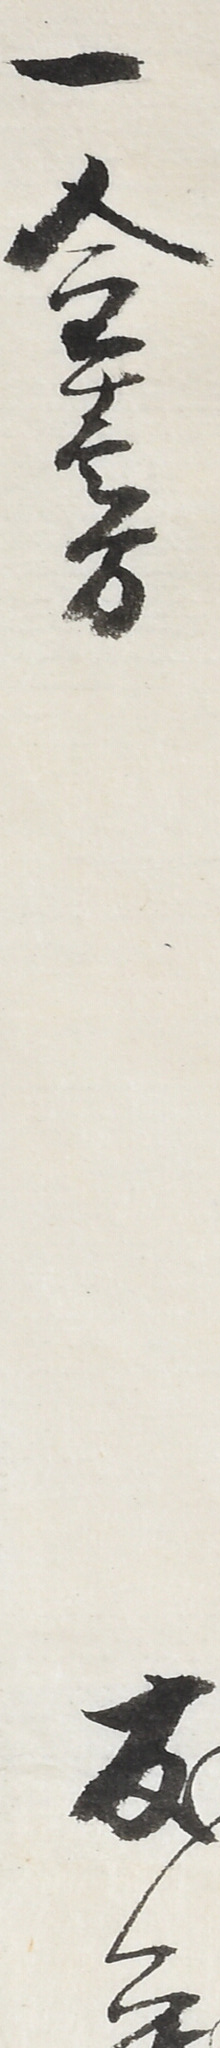一金壱分友蔵
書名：御拝地百五拾年御祝儀献上御目録名前
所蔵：伊那市立高遠町図書館・合同会社AMANE
